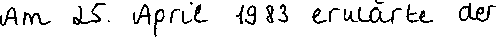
Am 25. April 1983 erklärte der
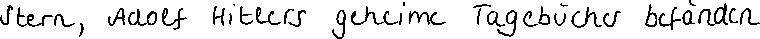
Stern, Adolf Hitlers geheime Tagebücher befänden
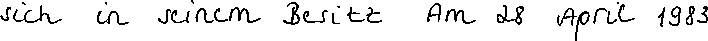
sich in seinem Besitz. Am 28. April 1983
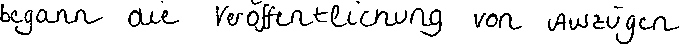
begann die Veröffentlichung von Auszügen
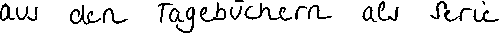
aus den Tagebüchern als Serie.
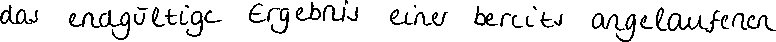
das endgültige Ergebnis einer bereits angelaufenen
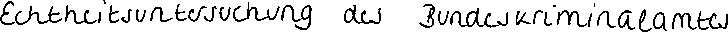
Echtheitsuntersuchung des Bundeskriminalamtes
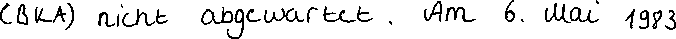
(BKA) nicht abgewartet. Am 6. Mai 1983
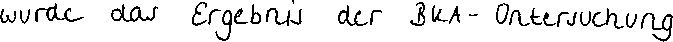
wurde das Ergebnis der BKA-Untersuchung
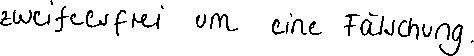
zweifelsfrei um eine Fälschung.
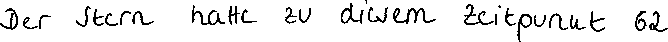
Der Stern hatte zu diesem Zeitpunkt 62
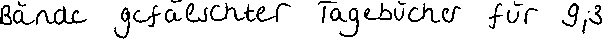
Bände gefälschter Tagebücher für 9,3
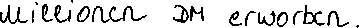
Millionen DM erworben.
